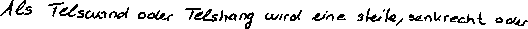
Als Felswand oder Felshang wird eine steile, senkrecht oder
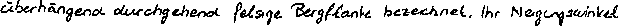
überhängend durchgehend felsige Bergflanke bezeichnet. Ihr Neigungswinkel
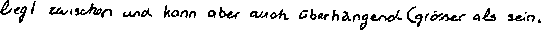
liegt zwischen und kann aber auch überhängend (größer als sein.
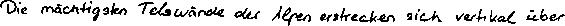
Die mächtigsten Felswände der Alpen erstrecken sich vertikal über
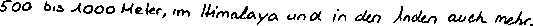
500 bis 1000 Meter, im Himalaya und in den Anden auch mehr.
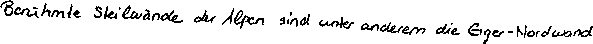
Berühmte Steilwände der Alpen sind unter anderem die Eiger-Nordwand
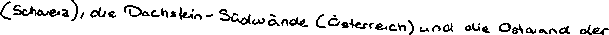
(Schweiz), die Dachstein-Südwände (Österreich) und die Ostwand der
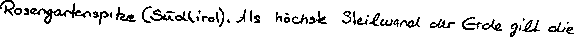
Rosengartenspitze (Südtirol). Als höchste Steilwand der Erde gilt die
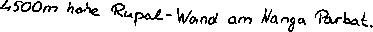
4500 m hohe Rupal-Wand am Nanga Parbat.
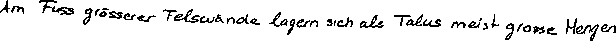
Am Fuß größerer Felswände lagern sich als Talus meist große Mengen
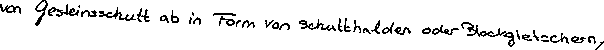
von Gesteinsschutt ab in Form von Schutthalden oder Blockgletschern,
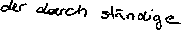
der durch ständige
